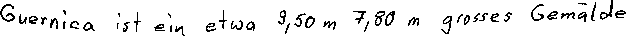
Guernica ist ein etwa 3,50 m 7,80 m großes Gemälde
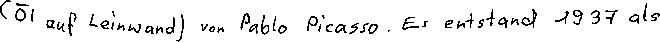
(Öl auf Leinwand) von Pablo Picasso. Es entstand 1937 als
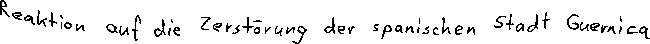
Reaktion auf die Zerstörung der spanischen Stadt Guernica
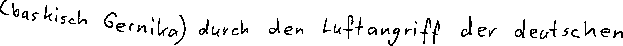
(baskisch Gernika) durch den Luftangriff der deutschen
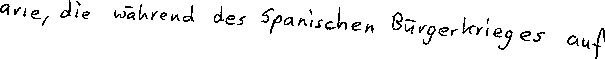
arie, die während des Spanischen Bürgerkrieges auf
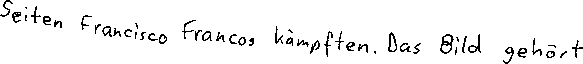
Seiten Francisco Francos kämpften. Das Bild gehört
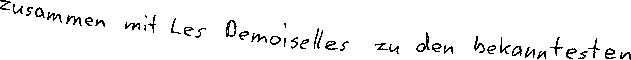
zusammen mit Les Demoiselles zu den bekanntesten
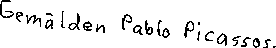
Gemälden Pablo Picassos.
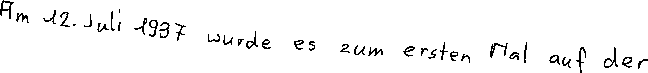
Am 12. Juli 1937 wurde es zum ersten Mal auf der
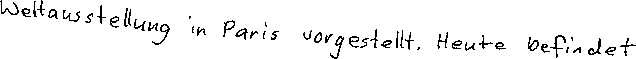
Weltausstellung in Paris vorgestellt. Heute befindet
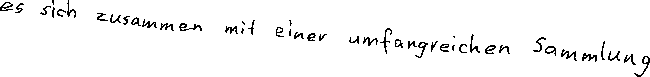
es sich zusammen mit einer umfangreichen Sammlung
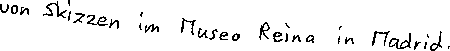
von Skizzen im Museo Reina in Madrid.
